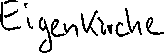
Eigenkirche
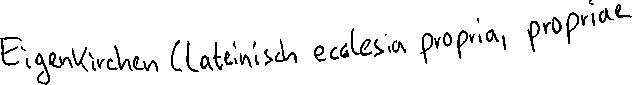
Eigenkirchen (lateinisch ecclesia propria, propriae
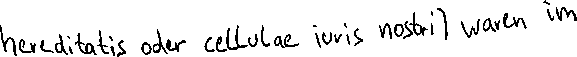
hereditatis oder cellulae iuris nostri) waren im
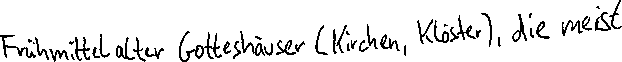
Frühmittelalter Gotteshäuser (Kirchen, Klöster), die meist
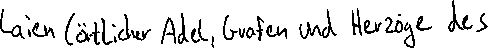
Laien (örtlicher Adel, Grafen und Herzöge des
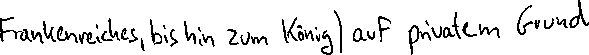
Frankenreiches, bis hin zum König) auf privatem Grund
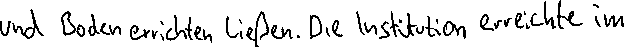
und Boden errichten ließen. Die Institution erreichte im
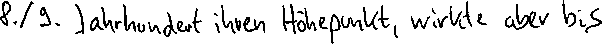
8./9. Jahrhundert ihren Höhepunkt, wirkte aber bis
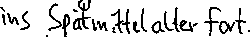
ins Spätmittelalter fort.
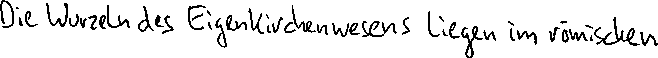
Die Wurzeln des Eigenkirchenwesens liegen im römischen
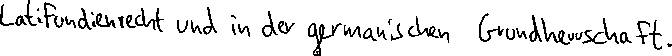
Latifundienrecht und in der germanischen Grundherrschaft.
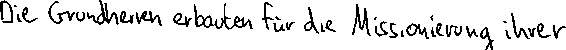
Die Grundherren erbauten für die Missionierung ihrer
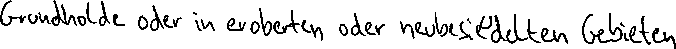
Grundholde oder in eroberten oder neubesiedelten Gebieten
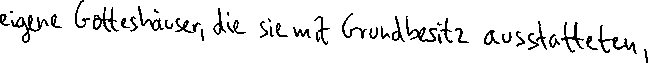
eigene Gotteshäuser, die sie mit Grundbesitz ausstatteten,
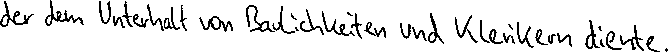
der dem Unterhalt von Baulichkeiten und Klerikern diente.
